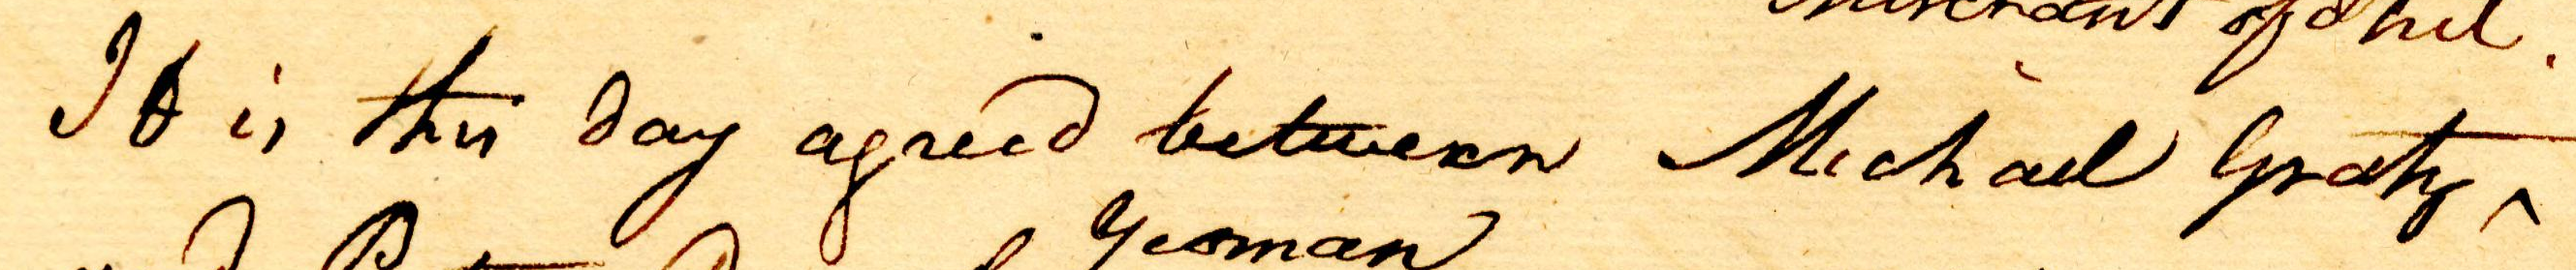It is this day agreed between Michael Gratz,
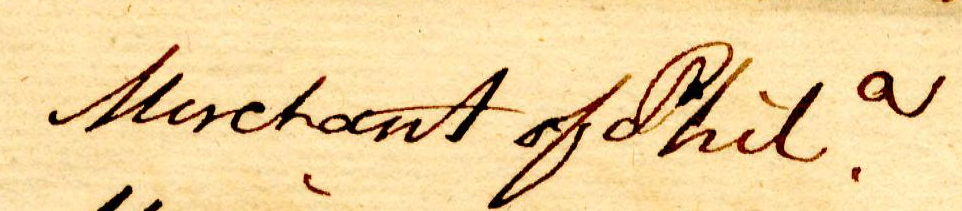Merchant of Phil^a.
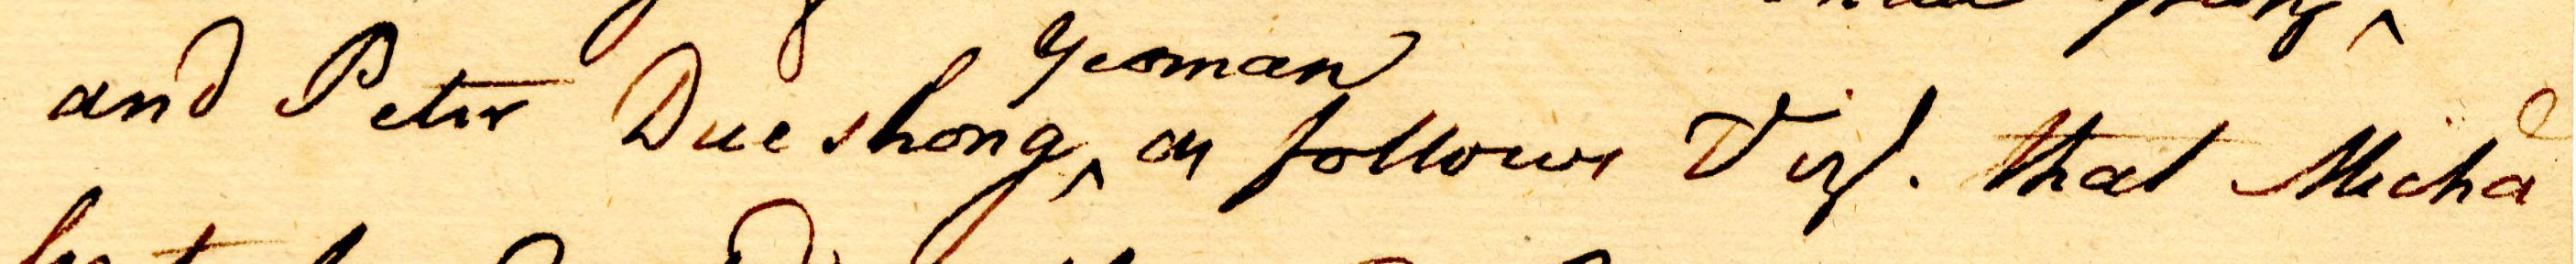and Peter Dueshong, as follows Viz^t. that Micha^l
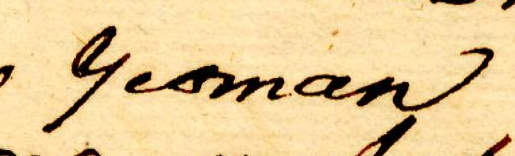Yeoman
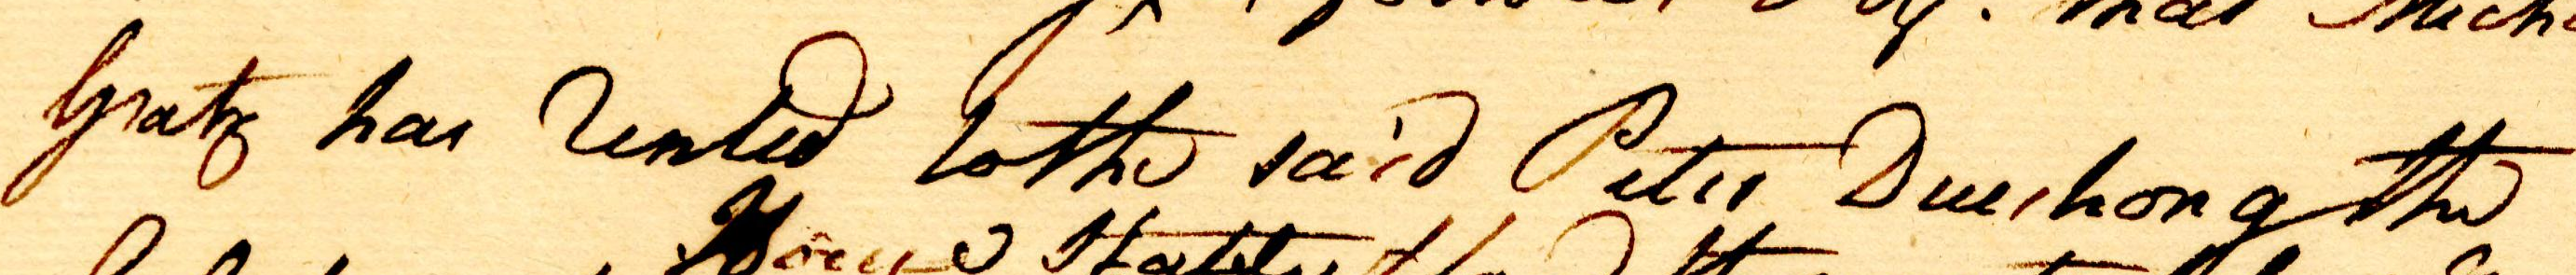Gratz has rented to the said Peter Dueshong the
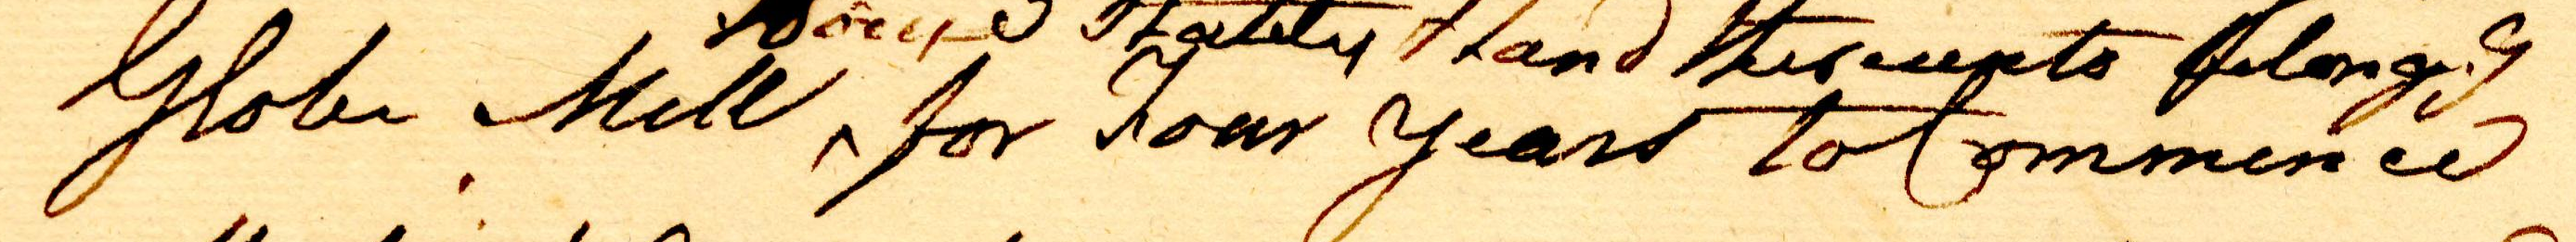Globe Mill ^ for Four Years to Commence
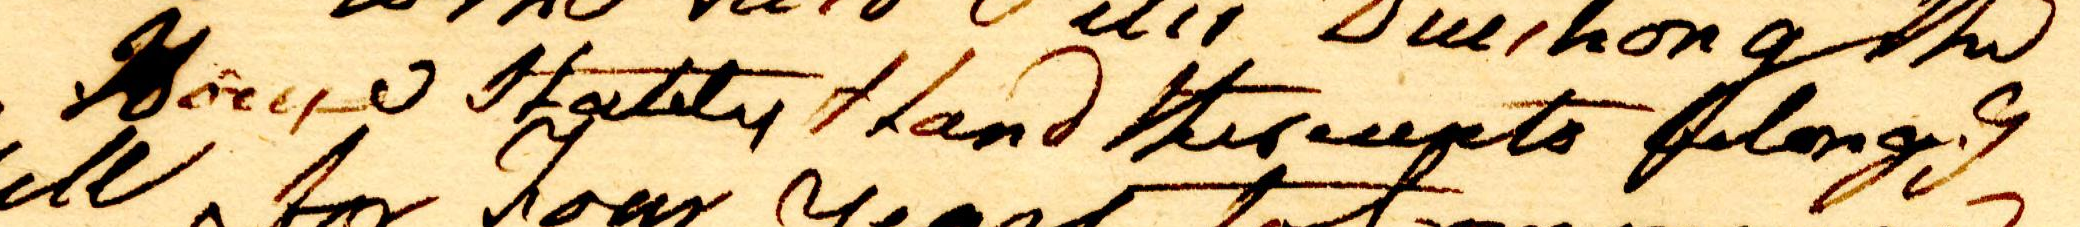House stalls & land thereunto belong^g
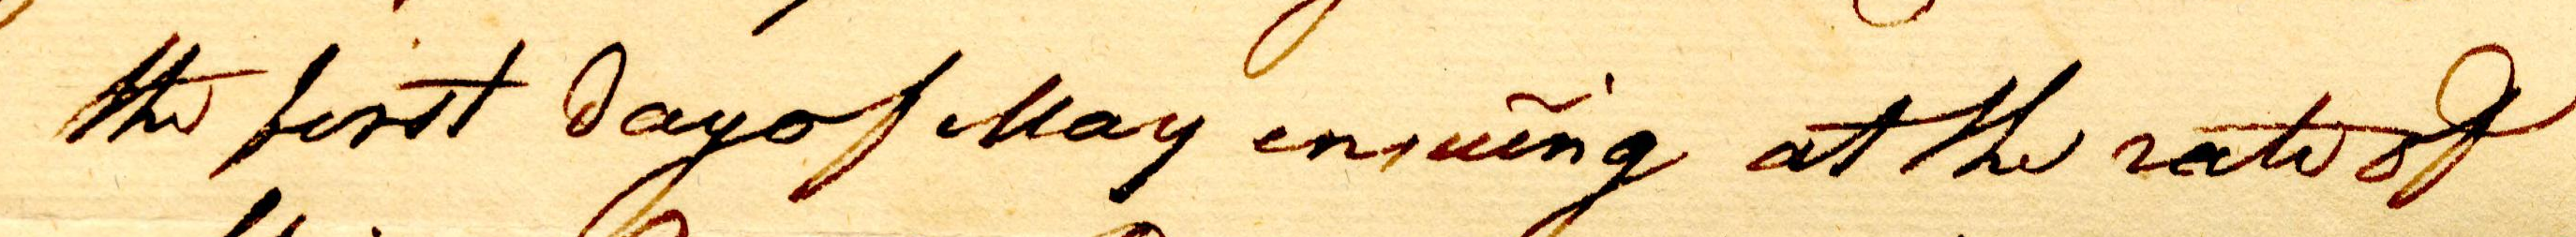the first day of May ensuing at the rate of
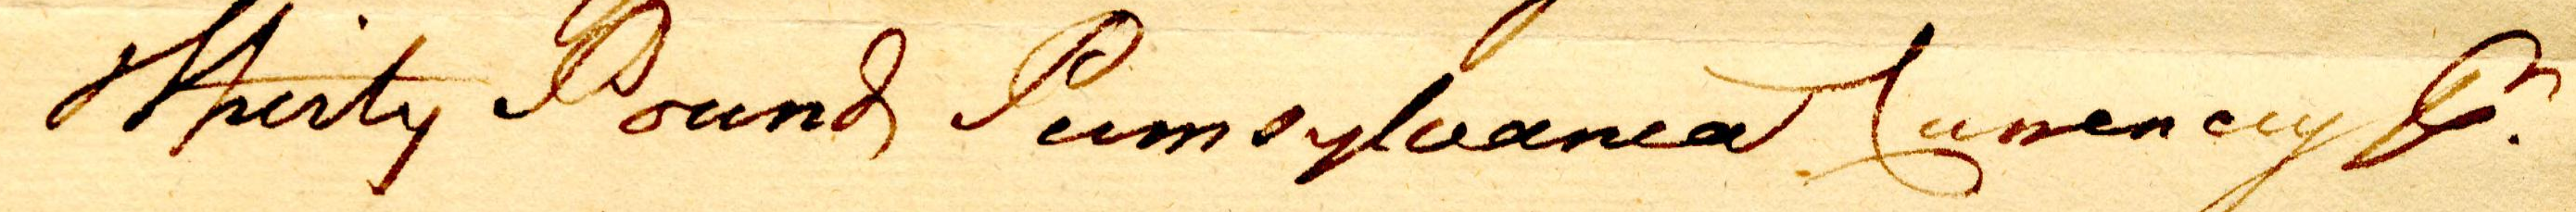Thirty Pound, Pennsylvania currency p^r.
